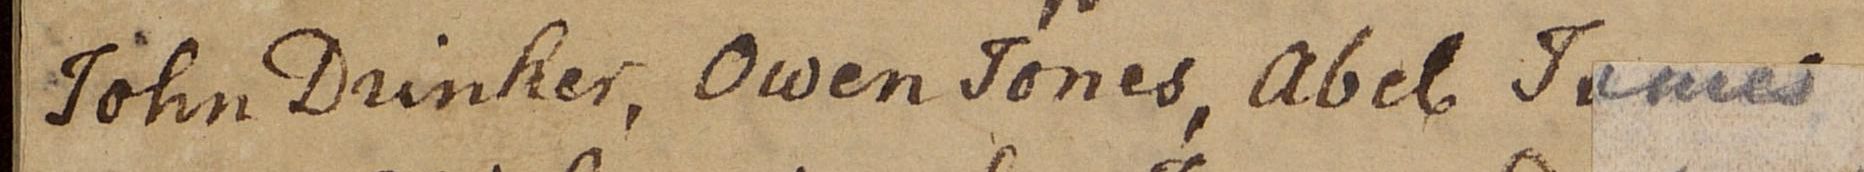John Drinker, Owen Jones, Abel James
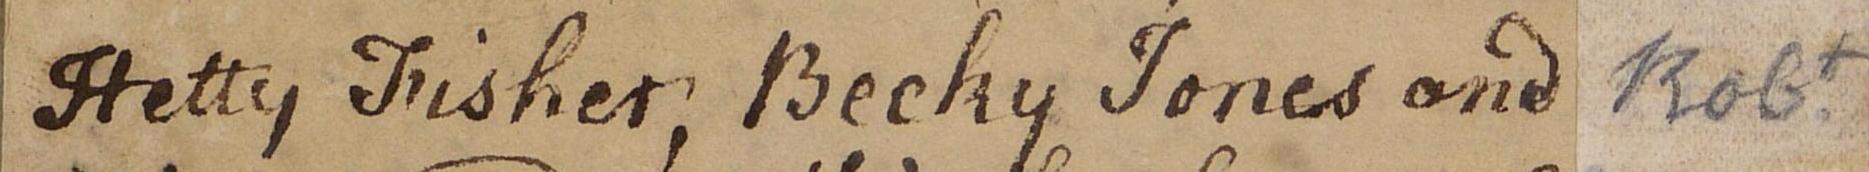Hetty Fisher, Becky Jones and Rob^t.
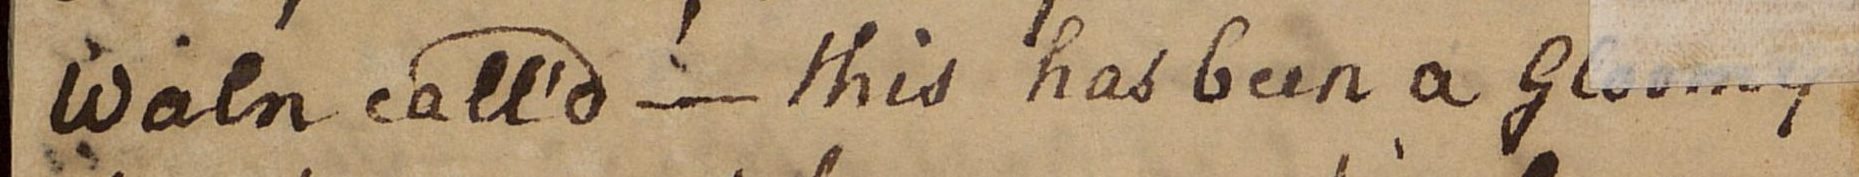Waln call'd- this has been a Gloomy
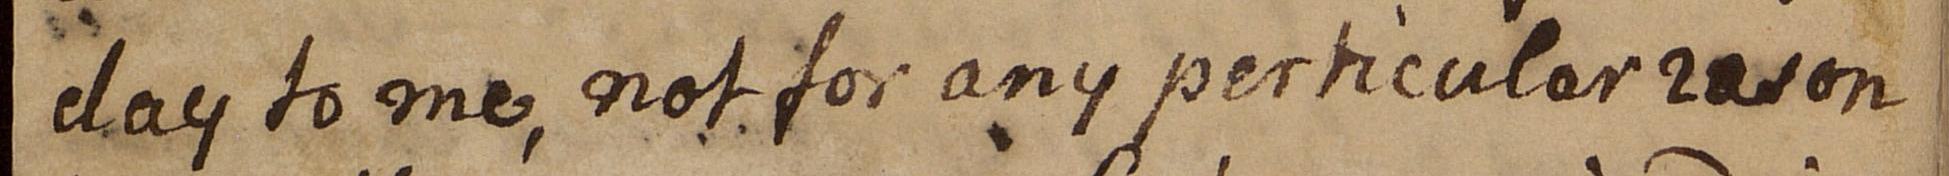day to me, not for any perticular rason
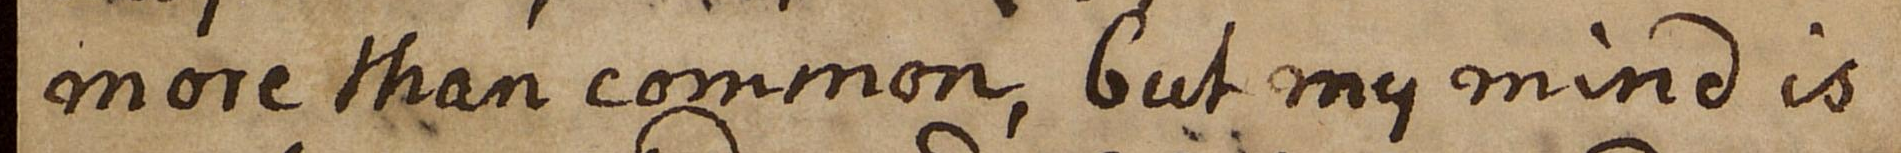more than common, but my mind is
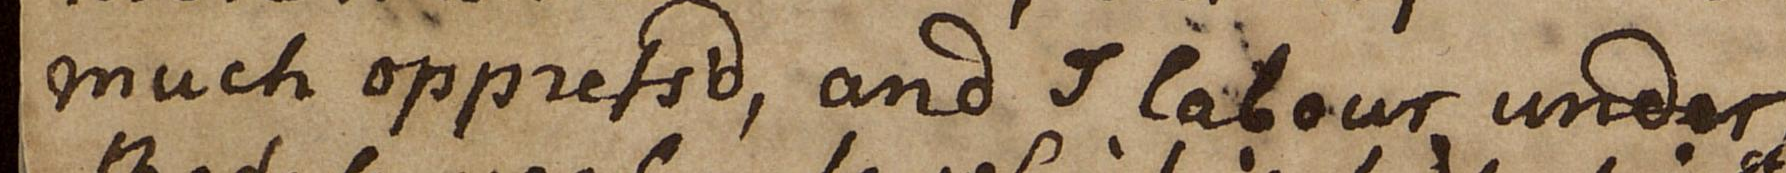much oppress'd, and I labour under
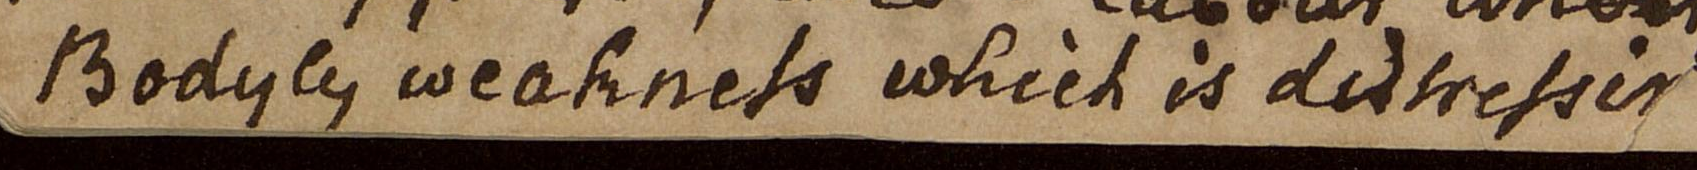Bodyly weakness which is distressin
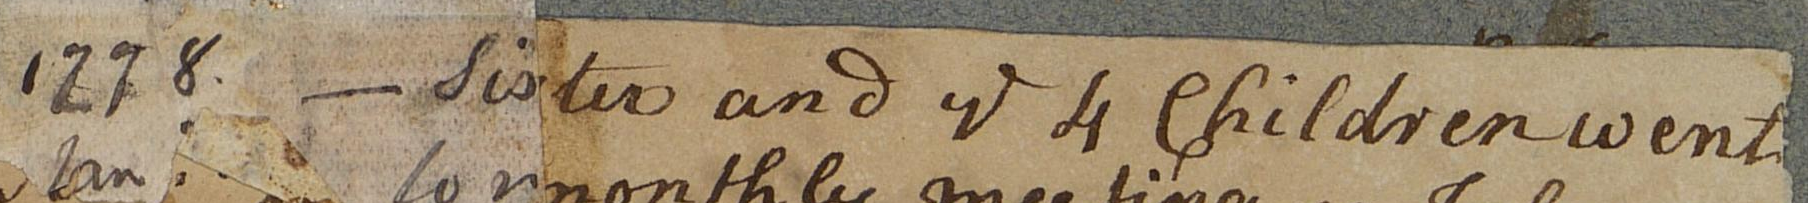1778- Sister and y^e 4 Children went
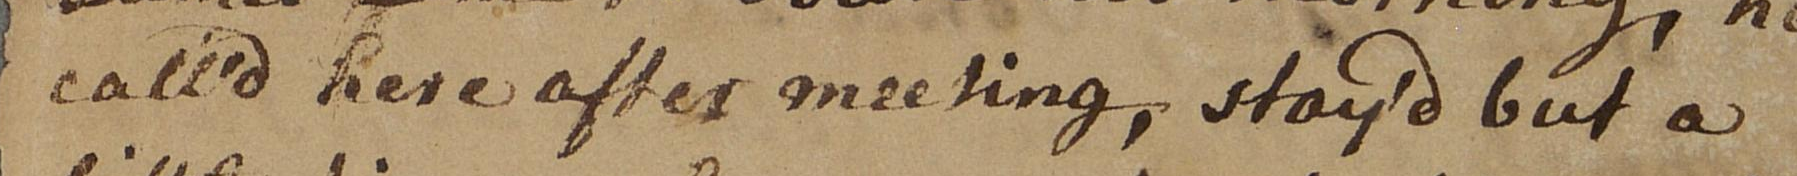call'd here after meeting, stay'd but a
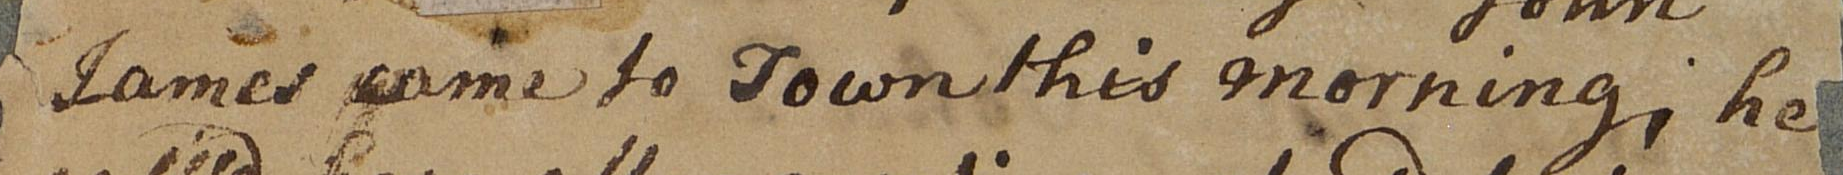James came to down this morning; he
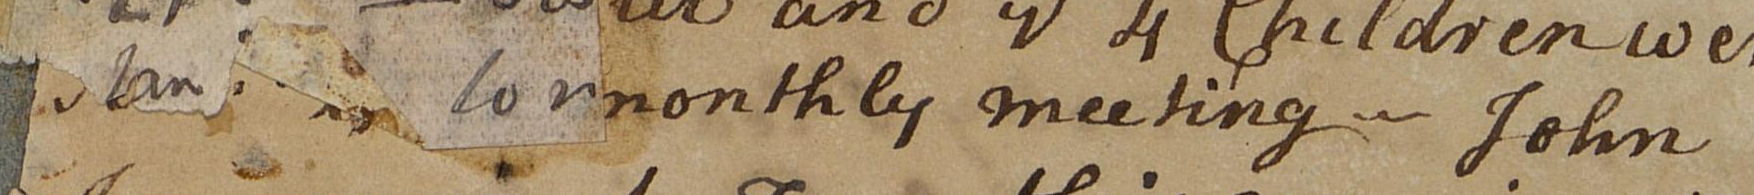[_____] to monthly meeting- John
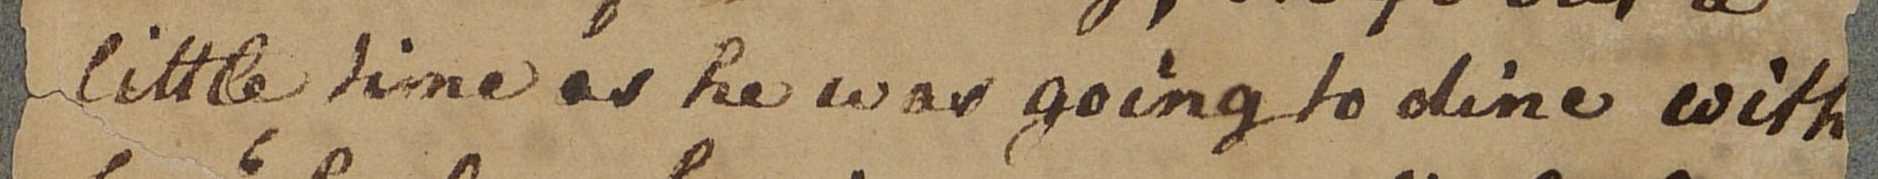little time as he was going to dine with
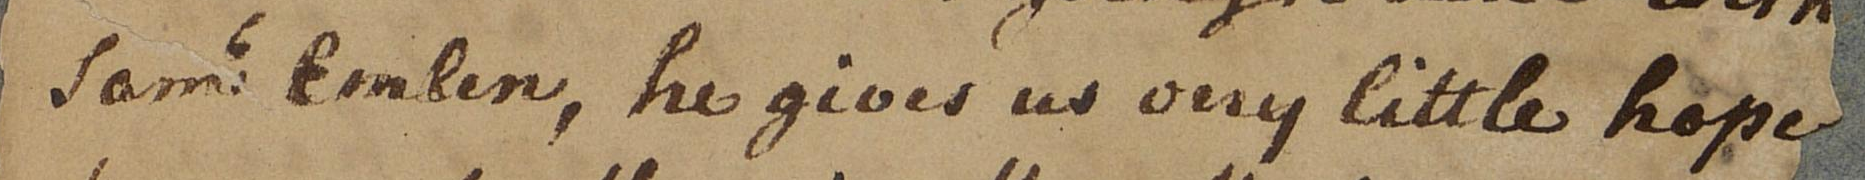Sam^l. Emlen, he gives us very little hope
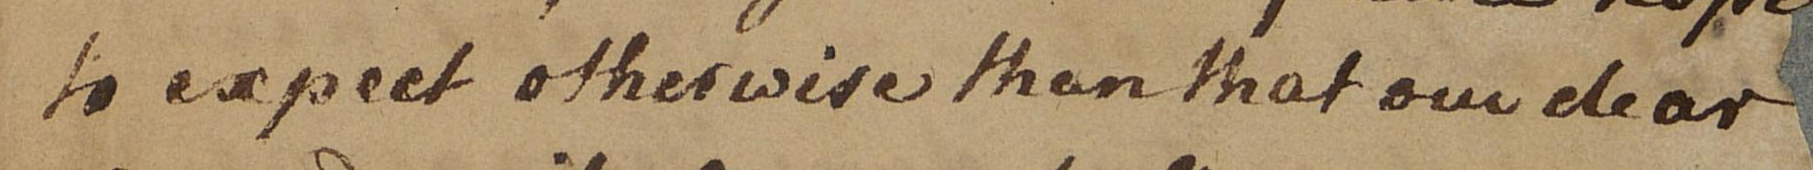to expect otherwise than that our dear
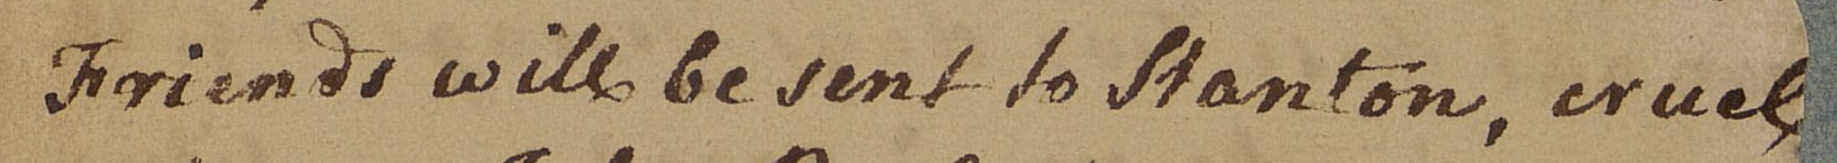Friends will be sent to Stanton, cruel
